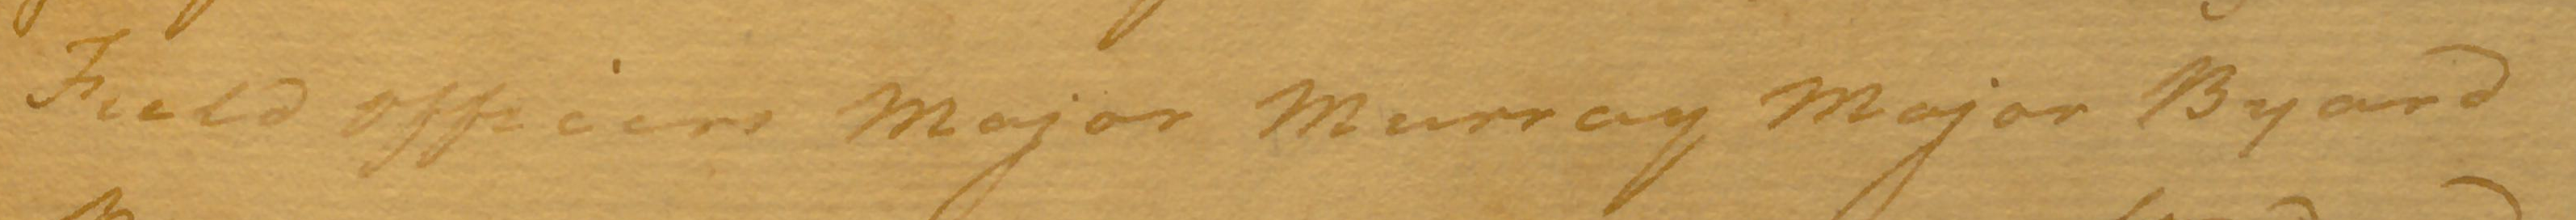Field Officers Major Murray Major Byard
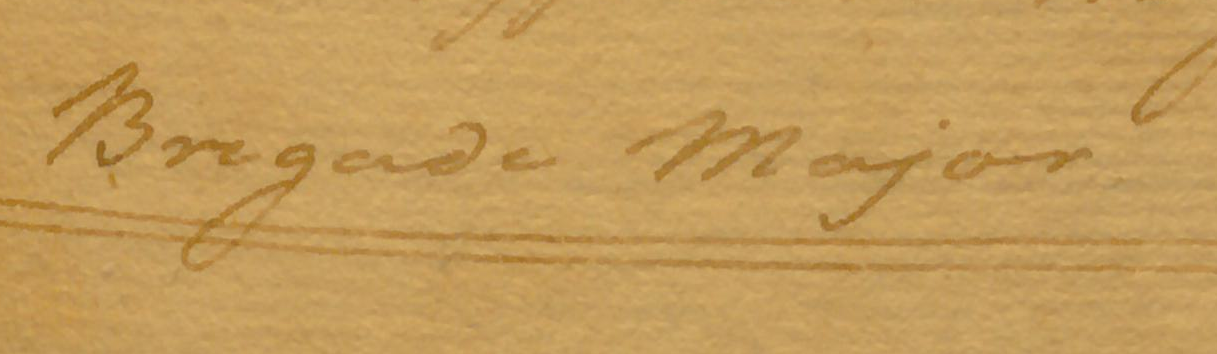Brigade Major
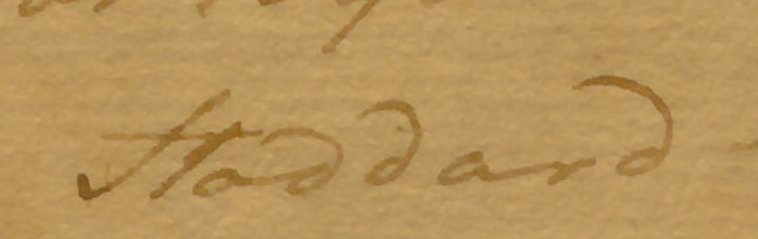Hoddard
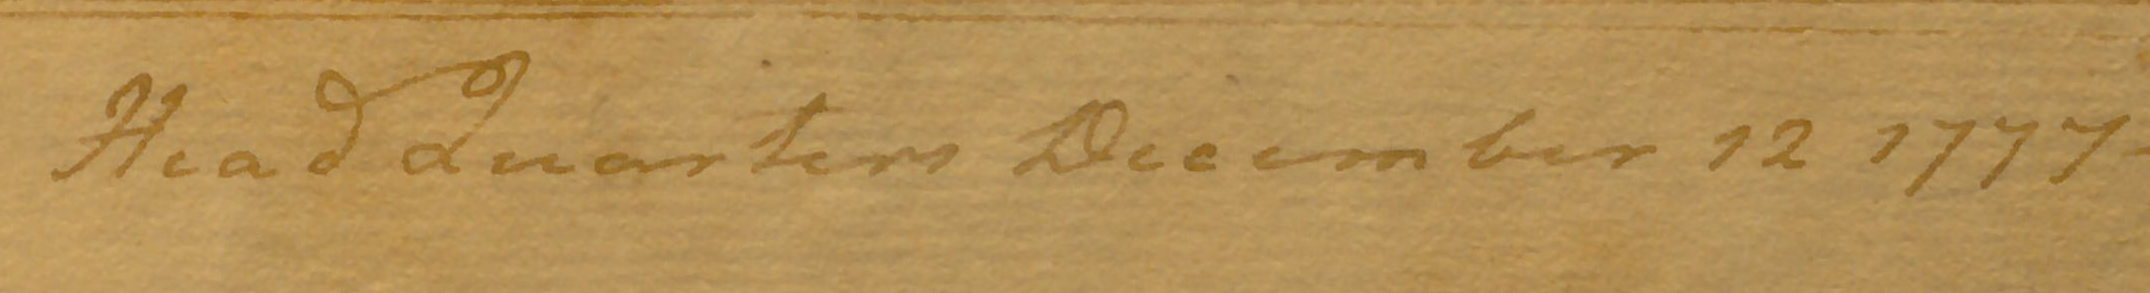Head Quarters December 12 1777
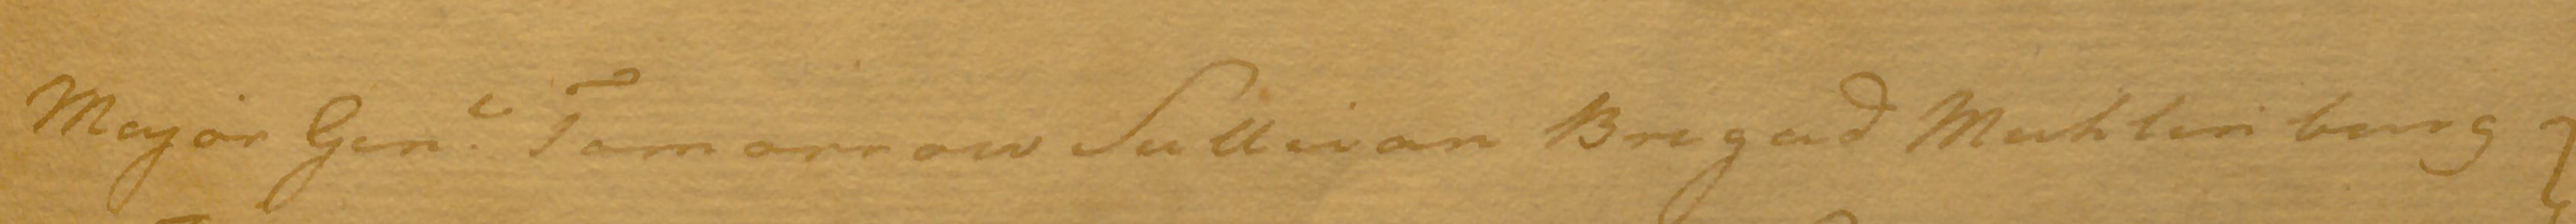Major Gen^l. Tomorrow Sullivan Brigad Muhlenburg
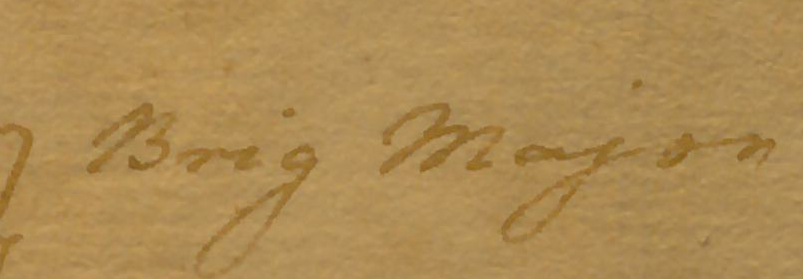Brig Major
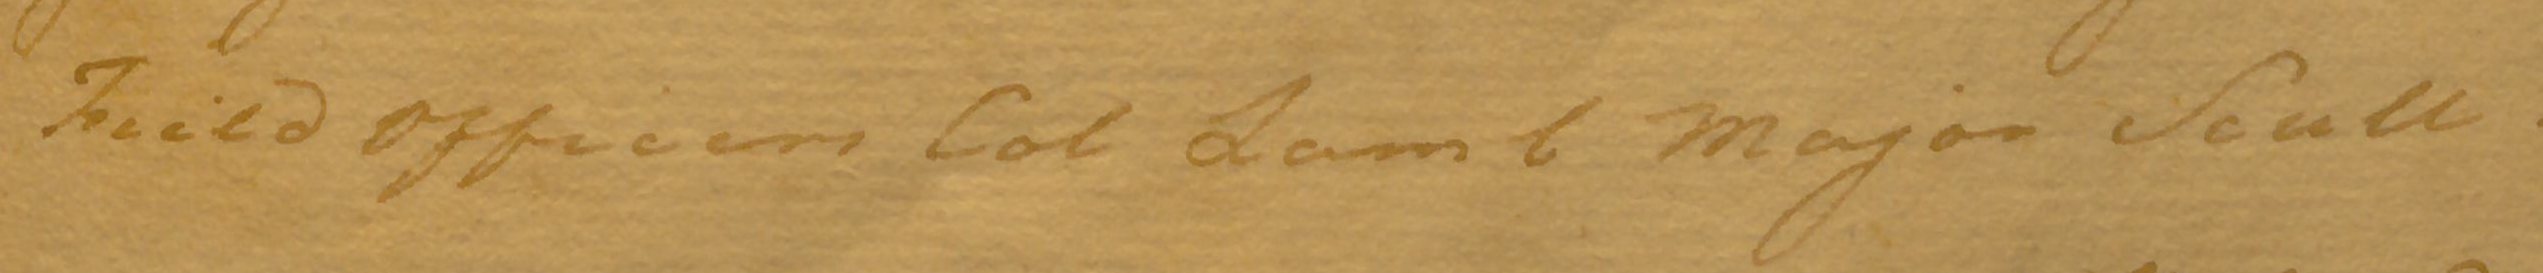Field Officers Col Lamb Major Scull
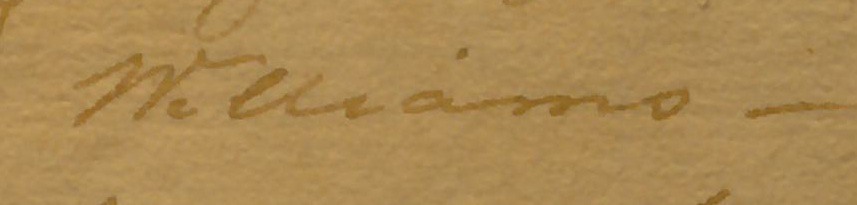Williams-
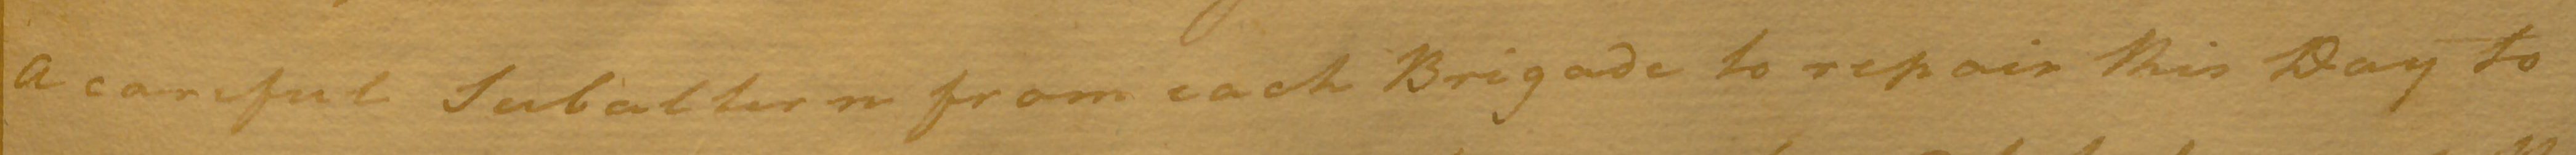a careful subaltern from each Brigade to repair this Day to
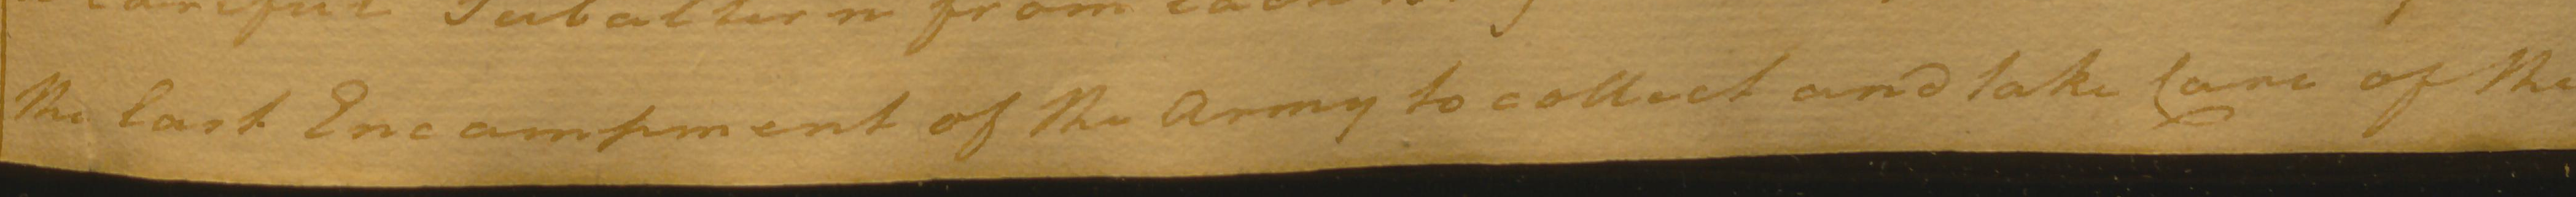the last Encampment of the Army to collect and take Care of the
